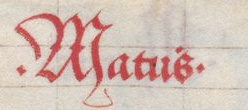.Matuṡ.
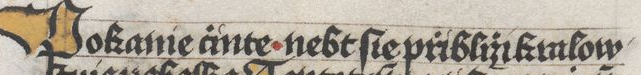Pokaníe ċinte.nebt ſie pṙibliżí kralow¬
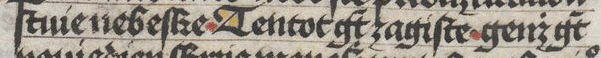ſtuíe nebeſke.Tento ḡt zagiſte.genż ḡt
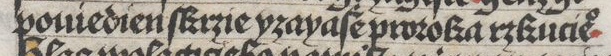pouíedien ſkrzie yzayaẛe proroka rzkucieo.
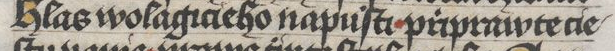Hlas wolagicieho napuẛti.pṙiprawte cie¬
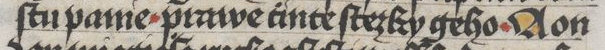ſtu panie.prawe ċinte ſtezky geho.A on
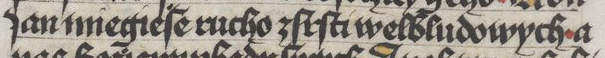Ian miegeẛe rucho zſrſti welbludowych.a
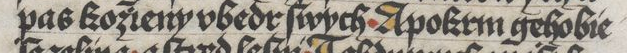pas kożieny vbedr ſwych.Apokrm geho bíe¬
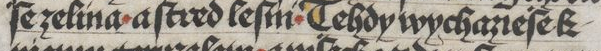ẛe zelína.aſtred leſní.Tehdy wychazieẛe k
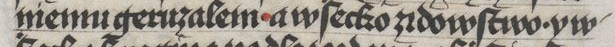niemu geruzalem.a wẛecko zidowſtwo.y w¬
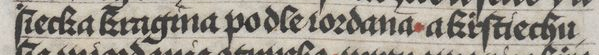ẛiecka kragina podle iordana.a kṙſtiechu
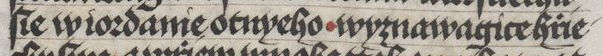ſie w iordanie otnyeho.wyznawagice hṙie¬
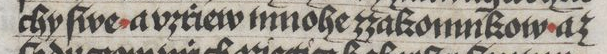chy ſwe.a vzṙiew mnohe zzakonníkow.a z
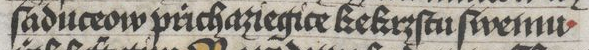ſaduceow pṙichaziegice kekrzſtu ſwemu.
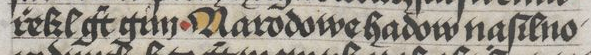ṙekl ḡt gim.Narodowe hadow naſilno¬
